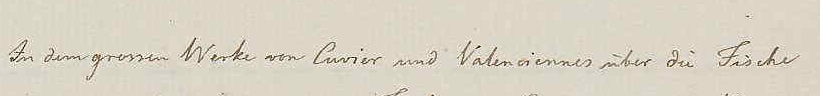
In dem grossen Werke von Cuvier und Valenciennes über die Fische
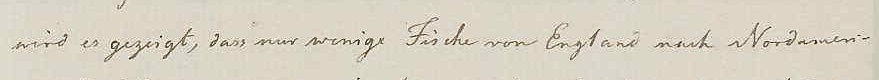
wird es gezeigt, dass nur wenige Fische von England nach Nordameri-
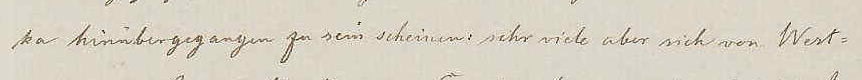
ka hinübergegangen zu sein scheinen: sehr viele aber sich von West-
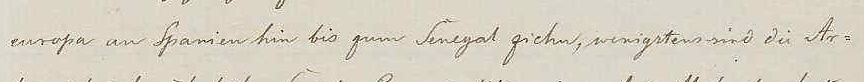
europa an Spanien hin bis zum Senegal ziehn, wenigstens sind die Ar-
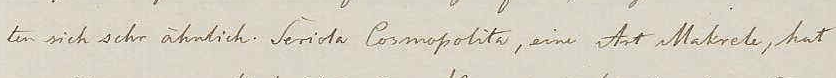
ten sich sehr ähnlich. Seriola Cosmopolita, eine Art Makrele, hat
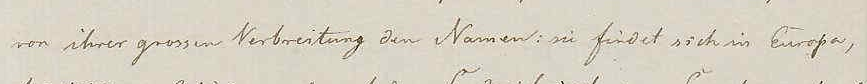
von ihrer grossen Verbreitung den Namen: sie findet sich in Europa,
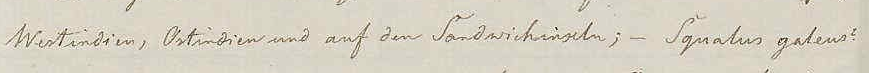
Westindien, Ostindien und auf den Sandwichinseln; – Squalus galeus ?
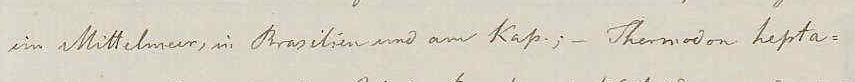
im Mittelmeer, in Brasilien und am Kap.; – Thermodon hepta-
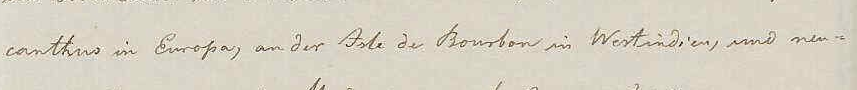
canthus in Europa, an der Isle de Bourbon in Westindien, und neu-
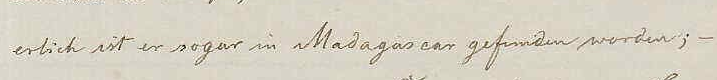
erlich ist er sogar in Madagascar gefunden worden; –
